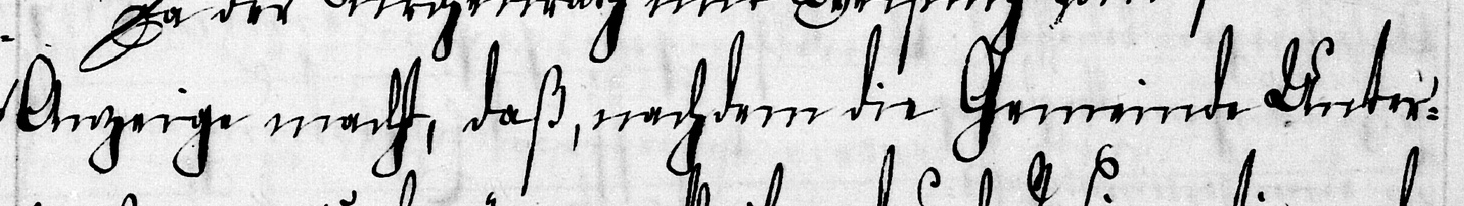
Anzeige macht, daß, nachdem die Gemeinde Unter¬
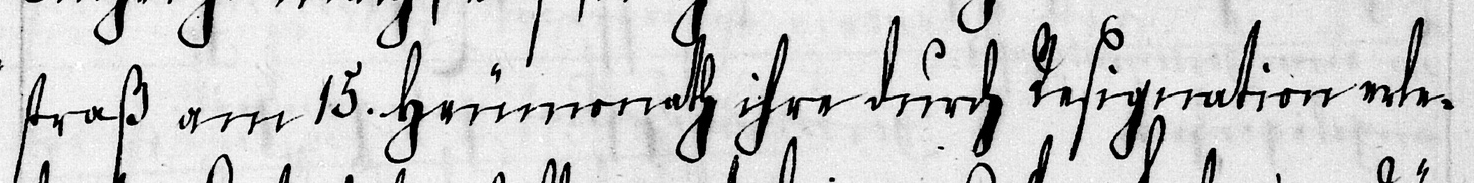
straß am 15. Heumonath ihre durch Resignation erle¬
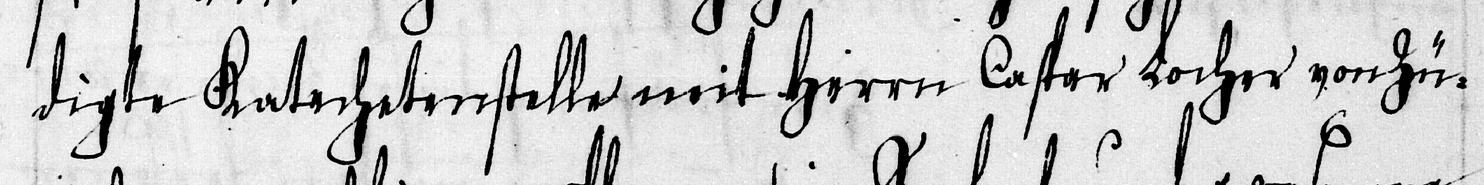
digte Katechetenstelle mit Herrn Caspar Locher von Zü¬
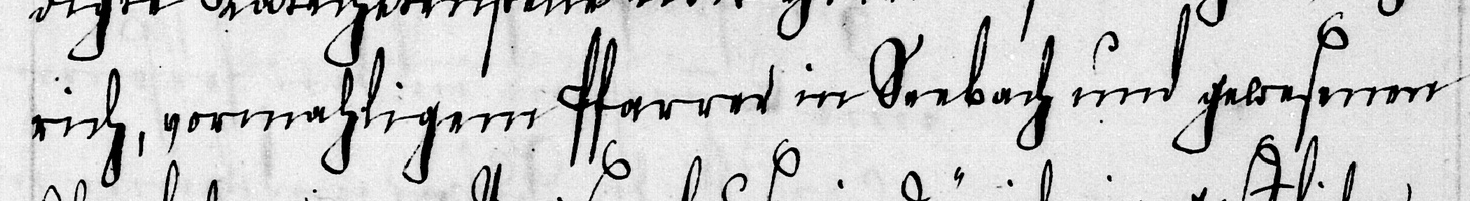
rich, vormahligem Pfarrer in Seebach und gewesenen
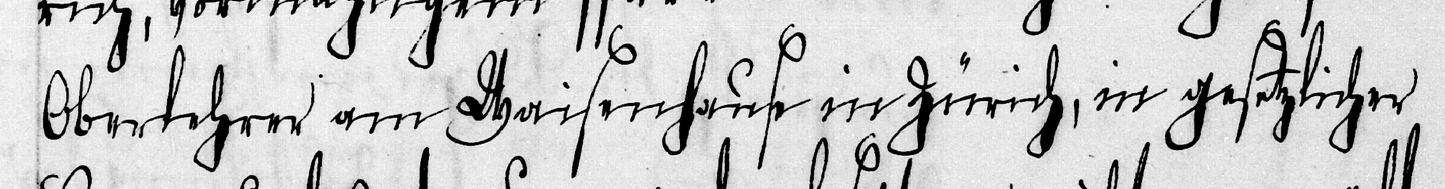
Oberlehrer am Waisenhause in Zürich, in gesetzlicher
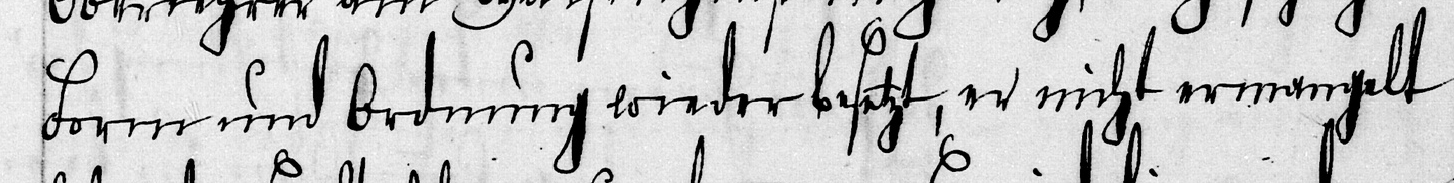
Form und Ordnung wieder besetzt, er nicht ermangelt
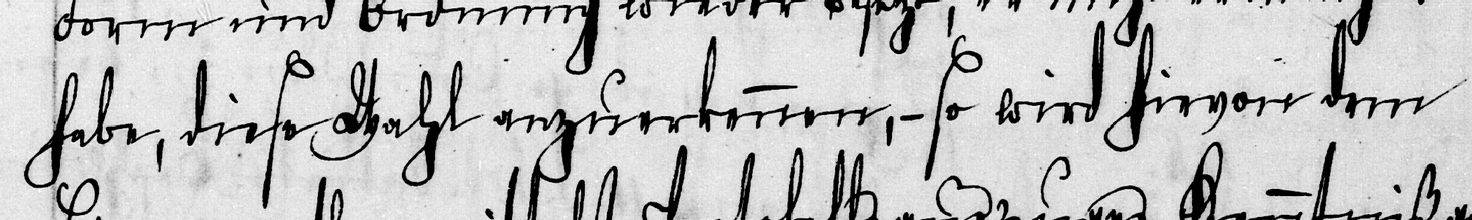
habe, diese Wahl anzuerkennen, – so wird hievon dem
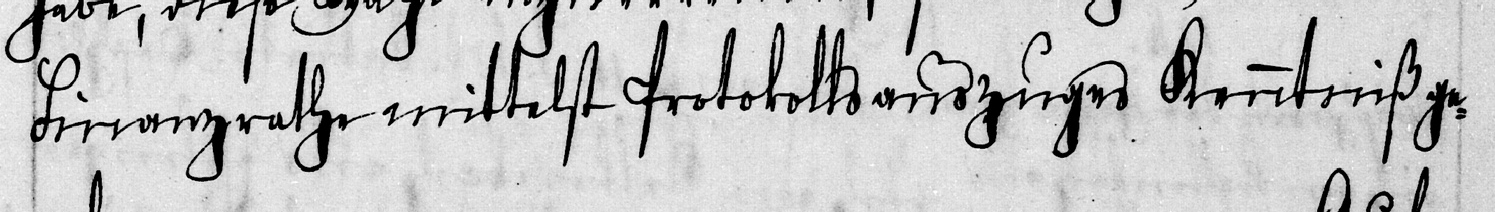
Finanzrathe mittelst Protokollsauszuges Kenntniß ge¬
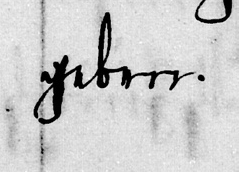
geben.
